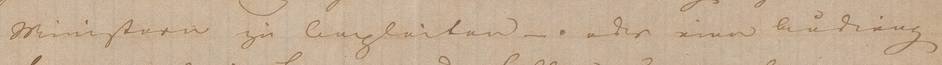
Ministern zu begleiten –. oder eine Audienz
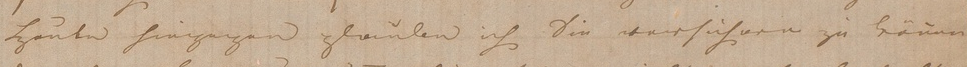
Heute hingegen glaube ich Sie versichern zu können
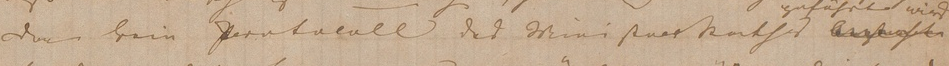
Da kein Protocoll des Ministerraths bestehtgeführt
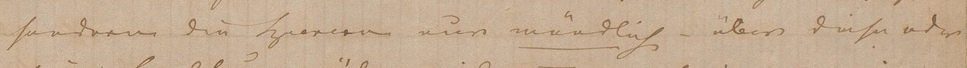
sondern die Herrn nur mündlich – über diese oder
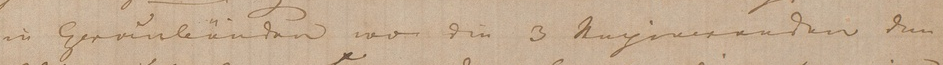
in Graubünden wo die 3 Regierenden den
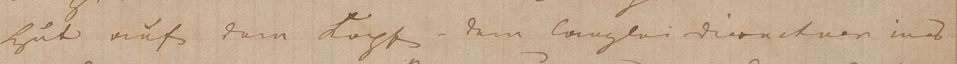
Hut auf dem Kopf – dem Canzlei Director ins
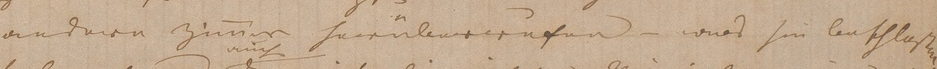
andere Zimmer herüberrufen – was sie beschloßen –
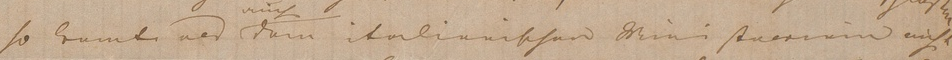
so komt es auch dem italienischen Ministerium nicht
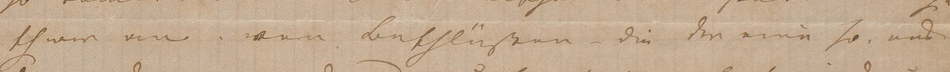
schwer an – von Beschlüßen – die der eine so – und
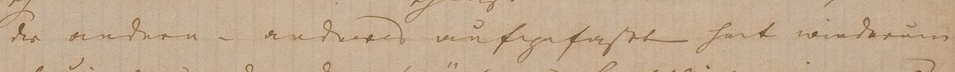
der andere anders – aufgefaßt hat wiederum
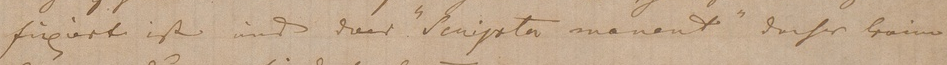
fixirt ist und das «Scripta manent» daher keine
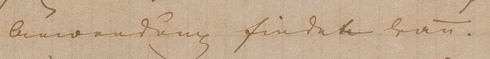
Anwendung finden kann.
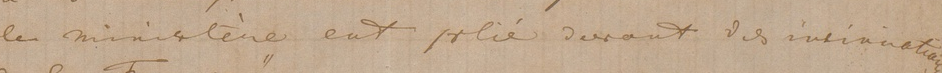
le ministère eut plié durant des insinuations
